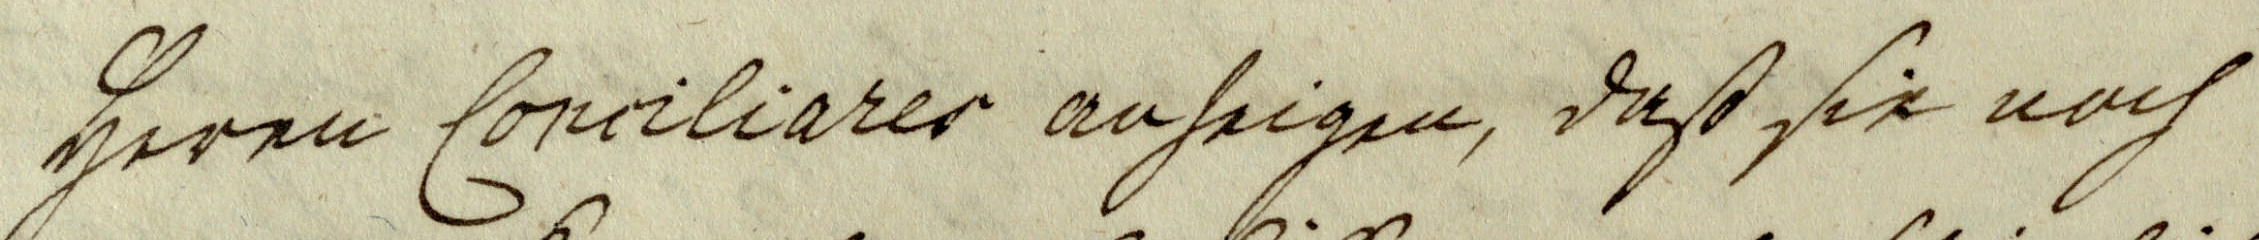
Herren Conciliares anzeigen, daß sie noch
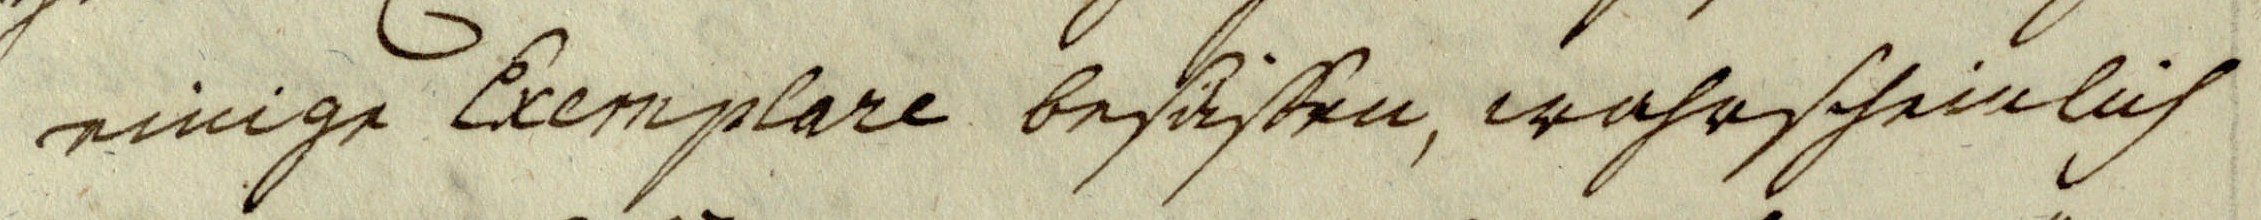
einige Exemplare besässen, wahrscheinlich
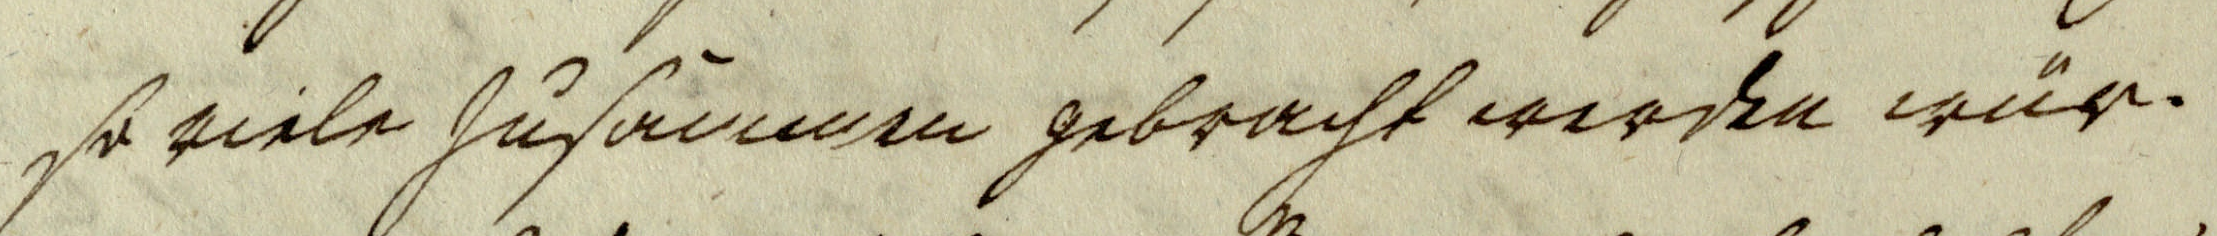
so viele zusammen gebracht werden wür¬
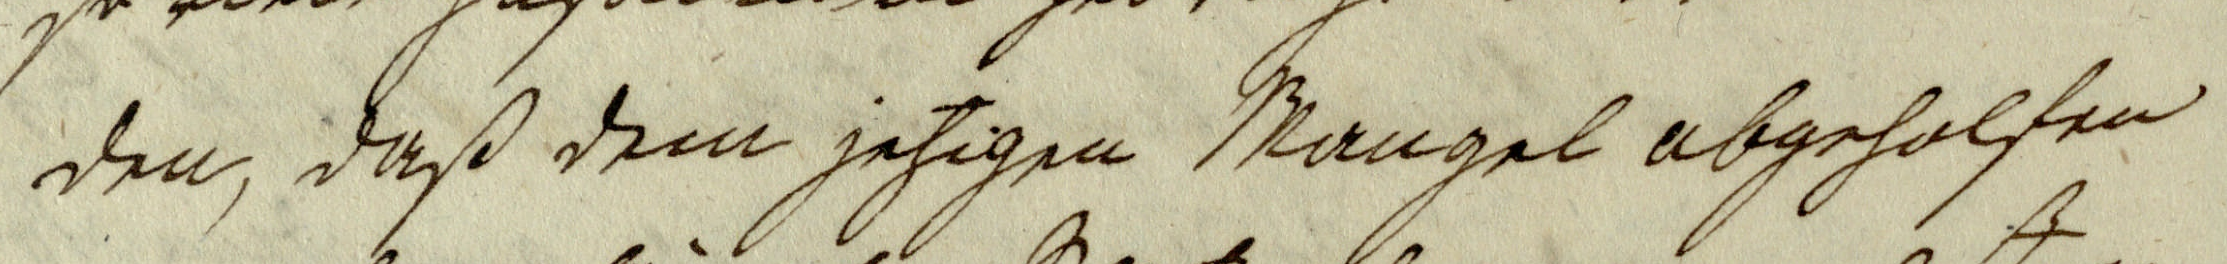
den, daß dem jetzigen Mangel abgeholfen
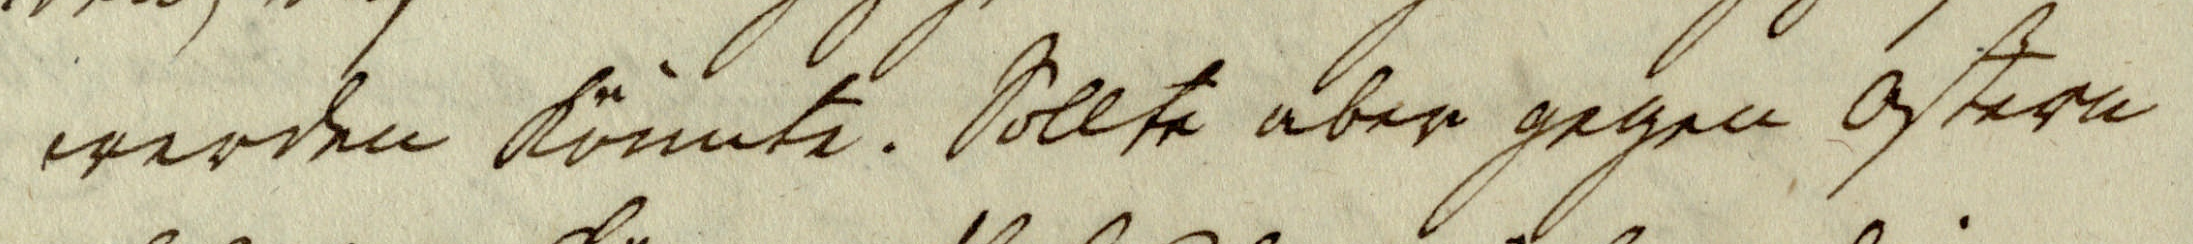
werden könnte. Sollte aber gegen Ostern
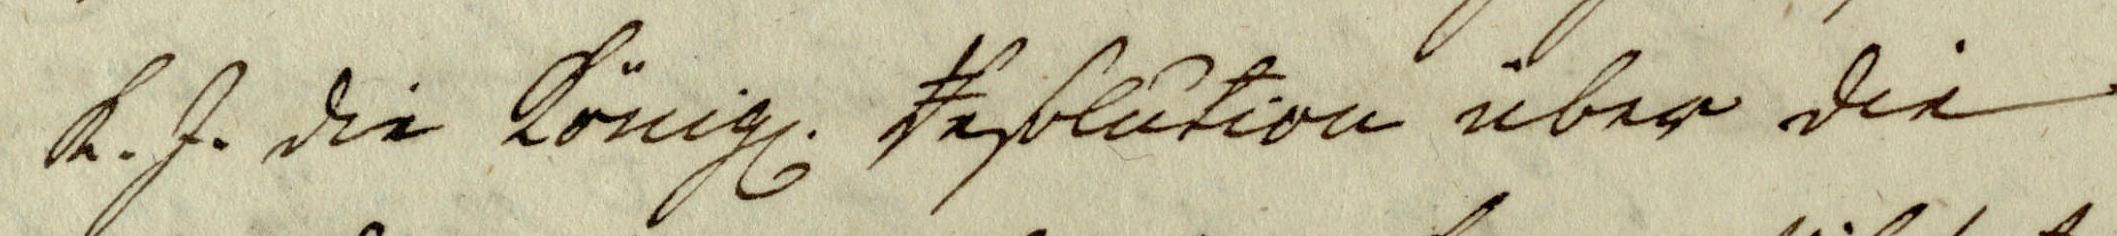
K. J. die Königl. Resolution über die
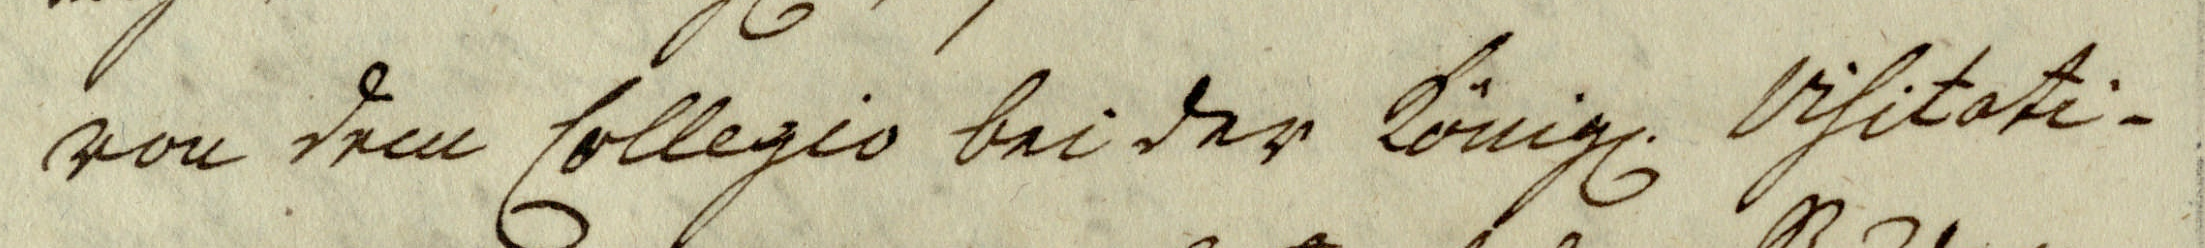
von dem Collegio bei der Königl. Visitati¬
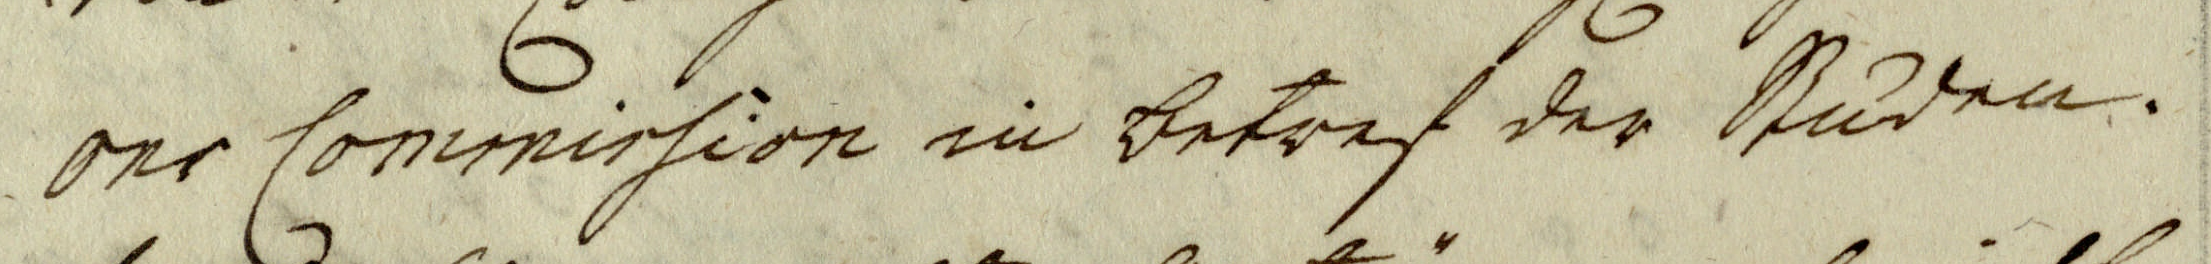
ons Commission in Betref der Studen¬
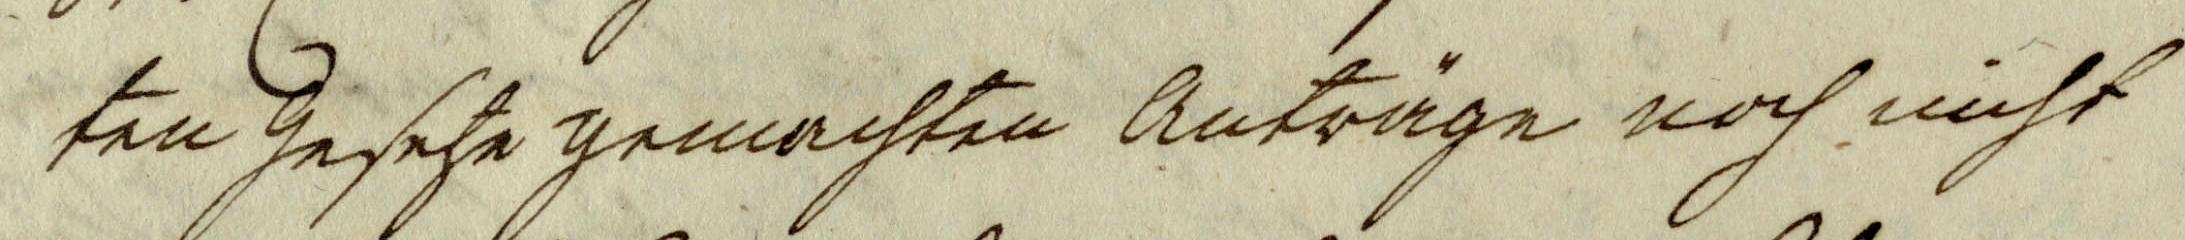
ten Gesetze gemachten Anträge noch nicht
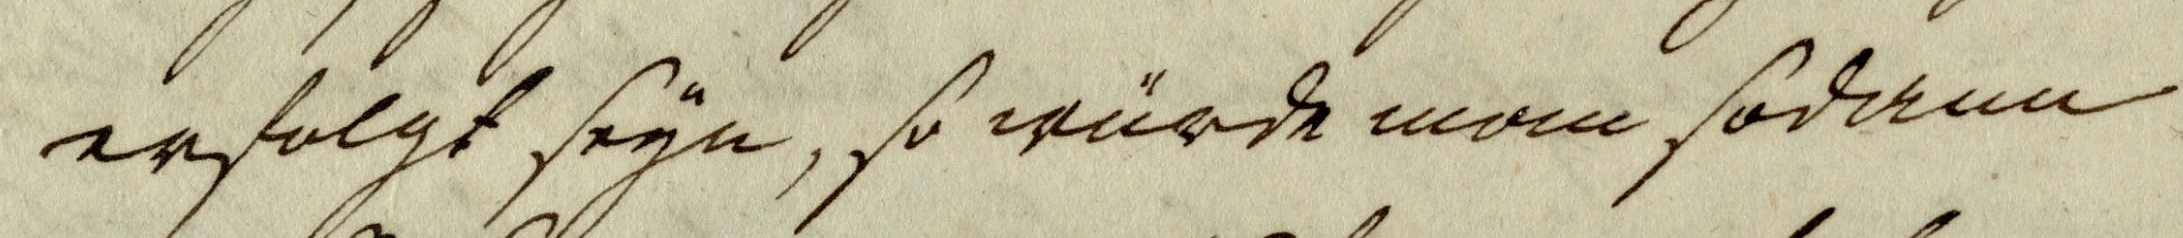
erfolgt seÿn, so würde man sodann
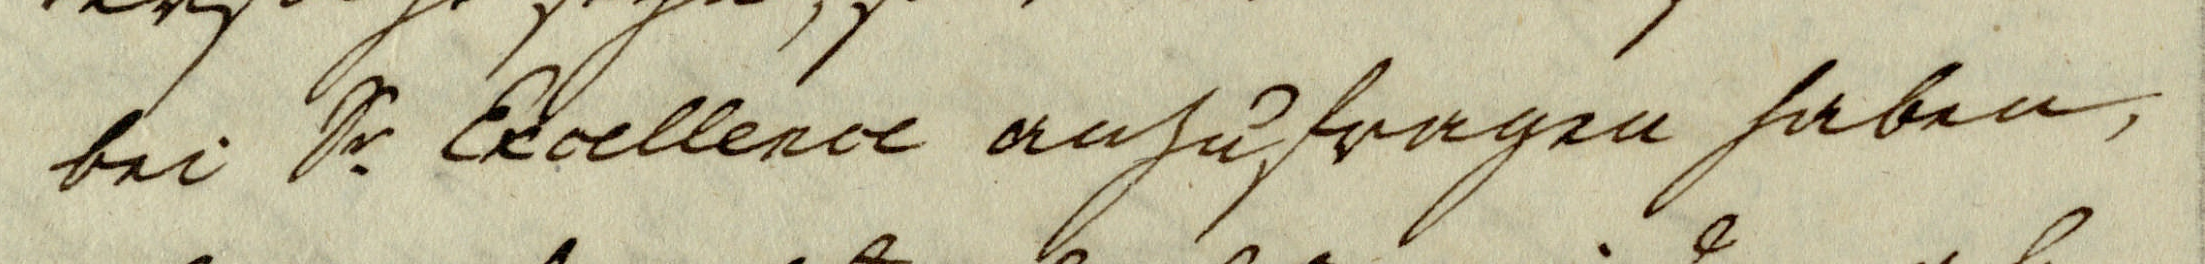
bei Sr. Excellence anzufragen haben,
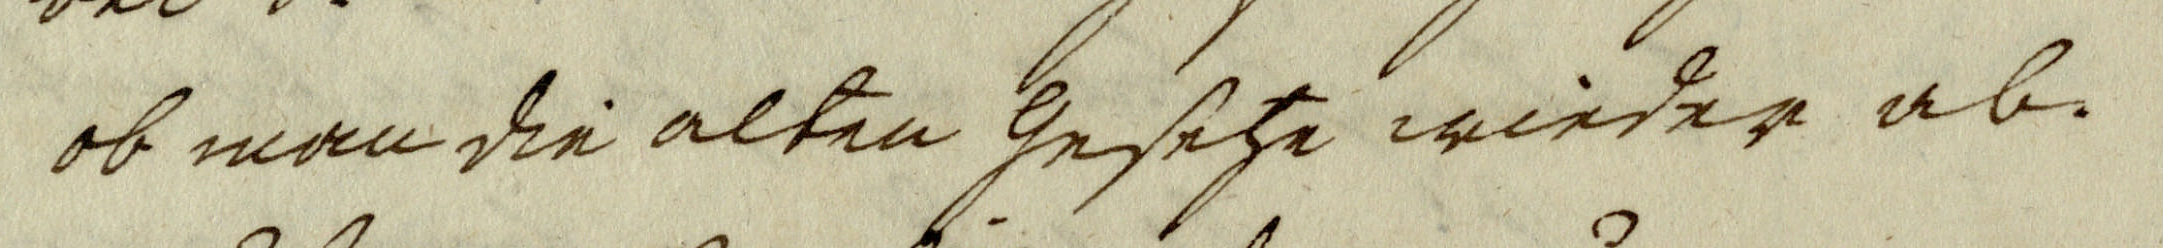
ob man die alten Gesetze wieder ab¬
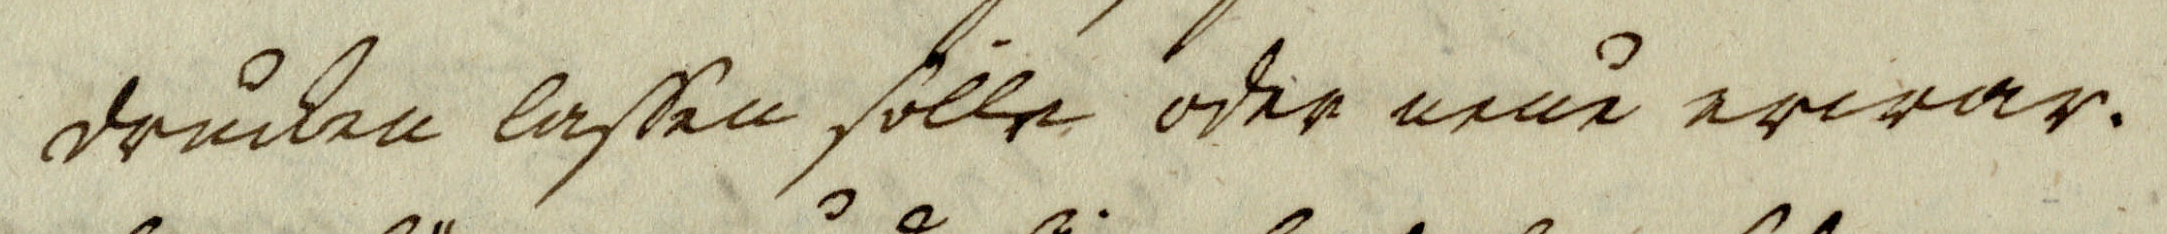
drucken lassen solle oder neue erwar¬
